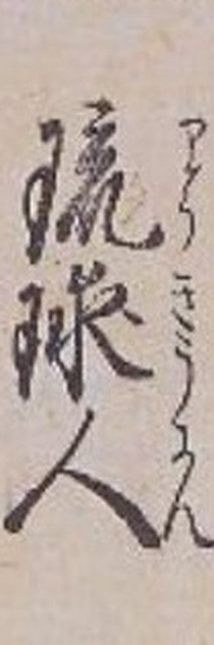琉球人
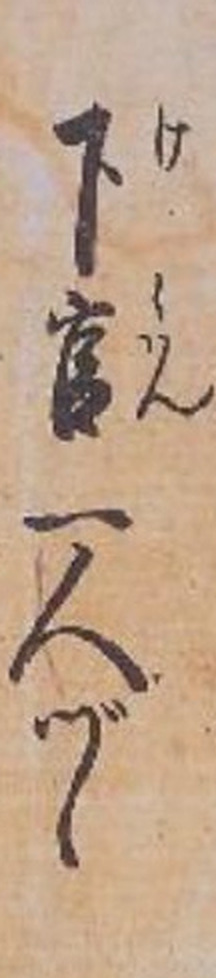下官一人づゝ

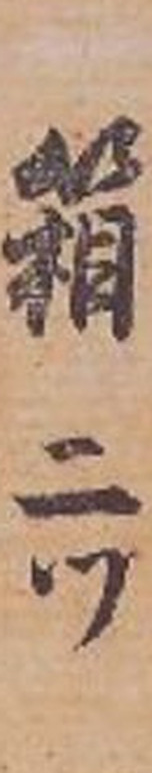箱二つ
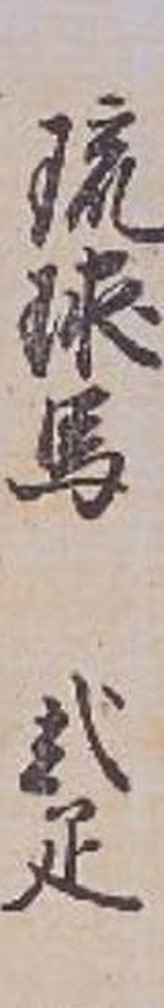琉球馬弐疋
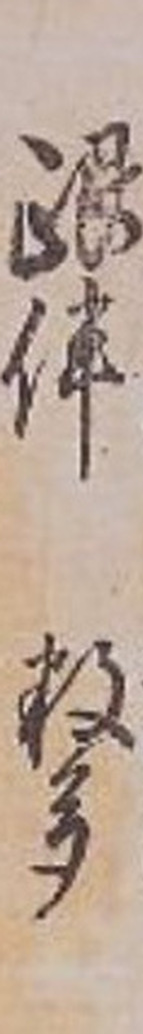跟伴数多
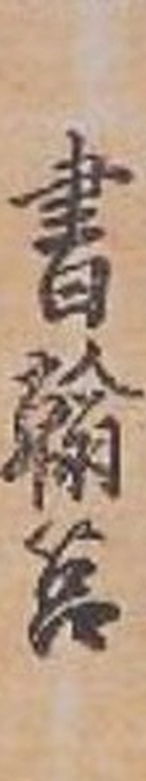書翰箱

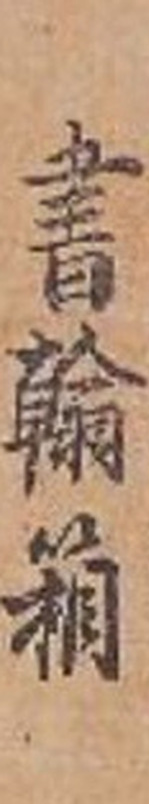書翰箱
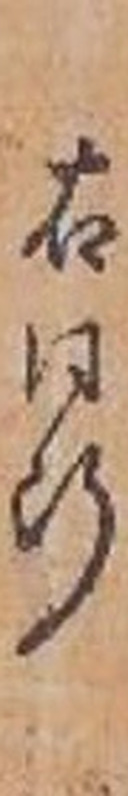右同行
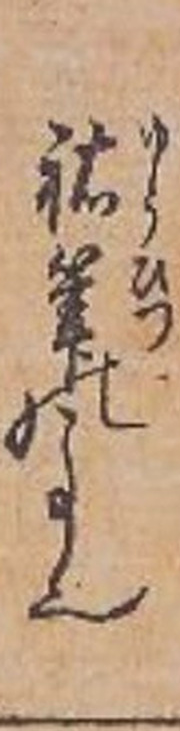祐筆の事也
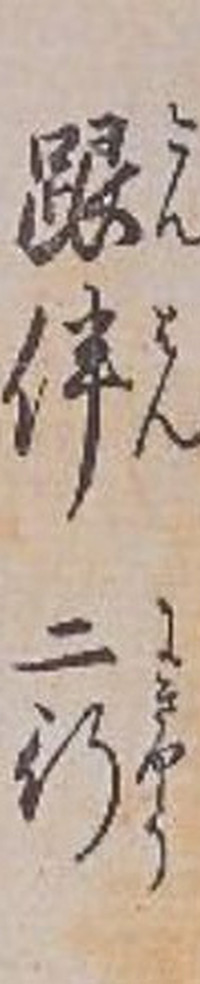跟伴二行
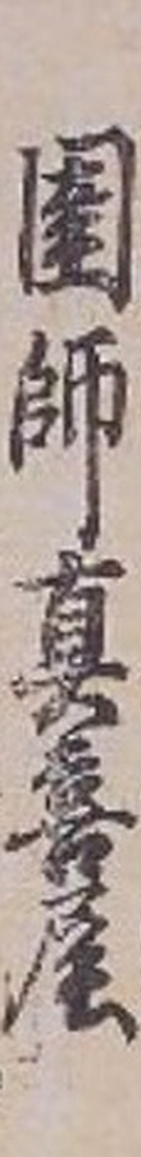圉師真喜屋
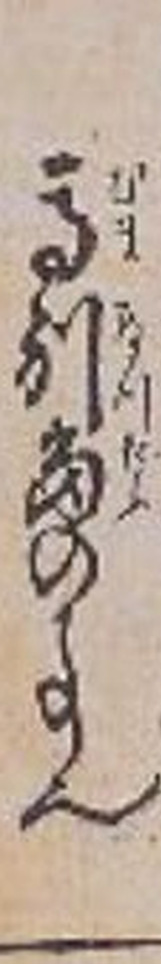馬別当の事也

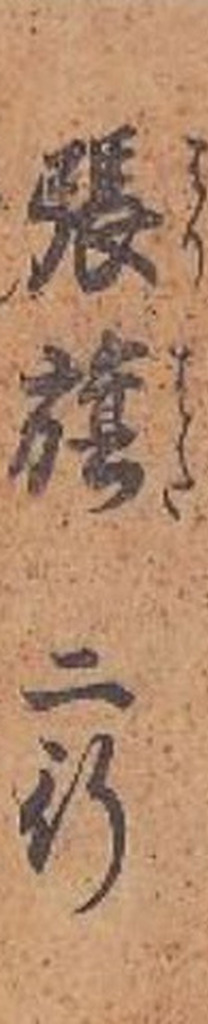張旗二行
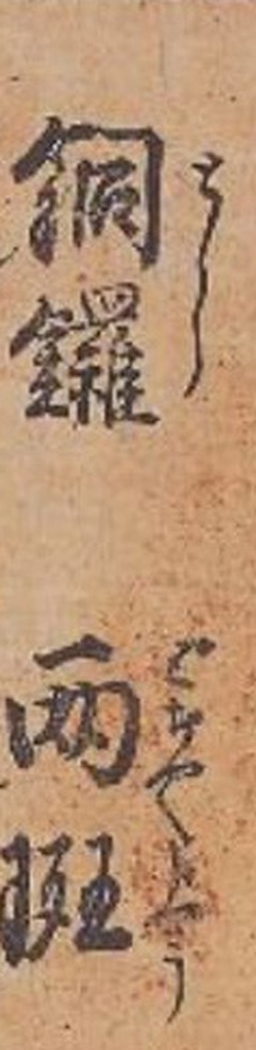銅鑼両班
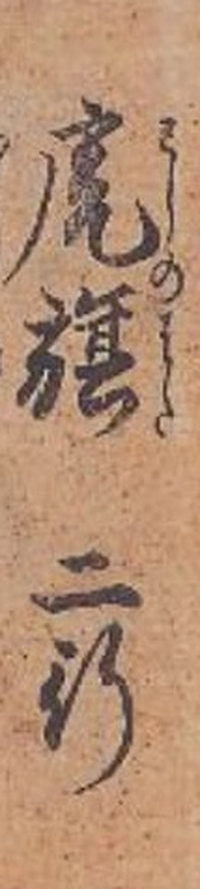虎旗二行

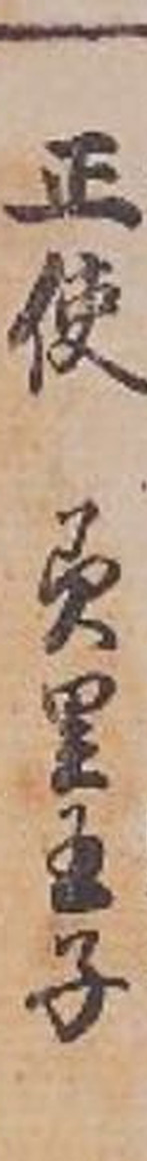正使美里王子
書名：琉球人大行列記 大全 来朝新板絵入
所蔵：University of the Ryukyus Library
